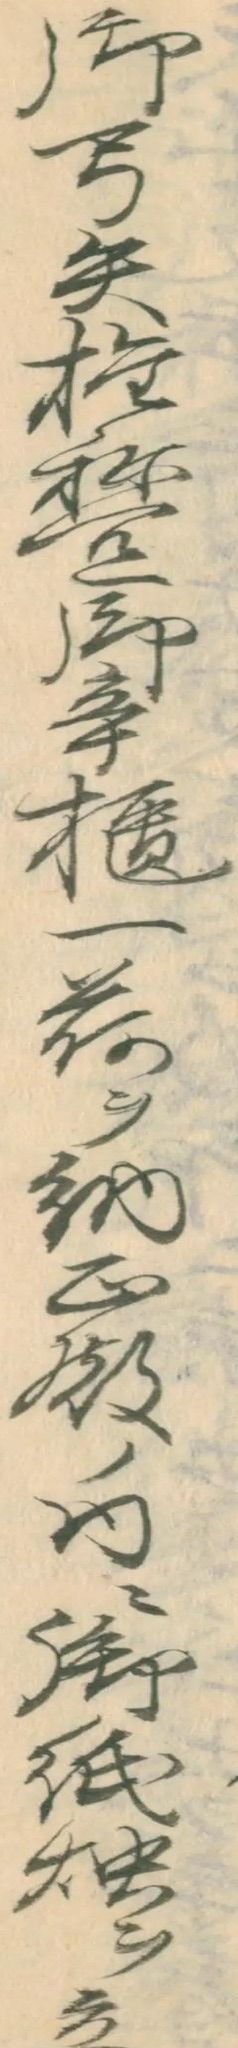御弓矢権祢宜御辛櫃一荷ヲ納正殿ノ内ニ御紙煙ヲ立
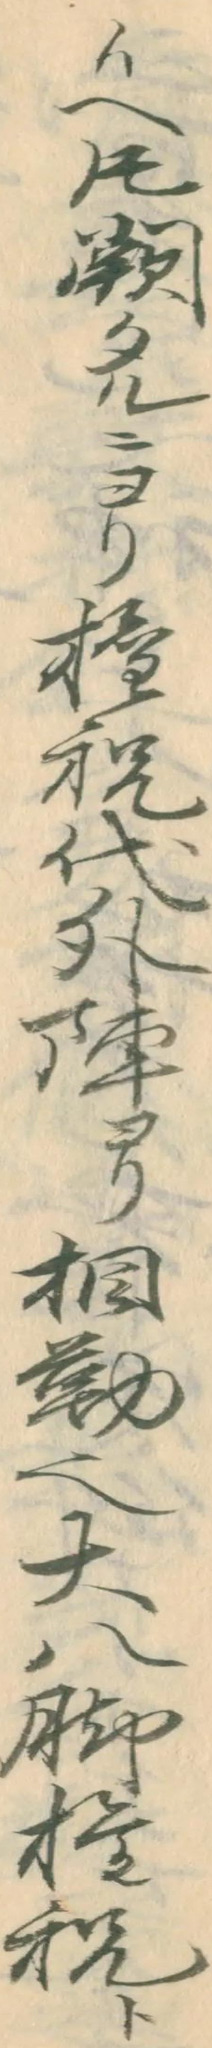候ヘトモ闕タルニヨリ権祝代外陣ヨリ相勤也大八脚権祝ト
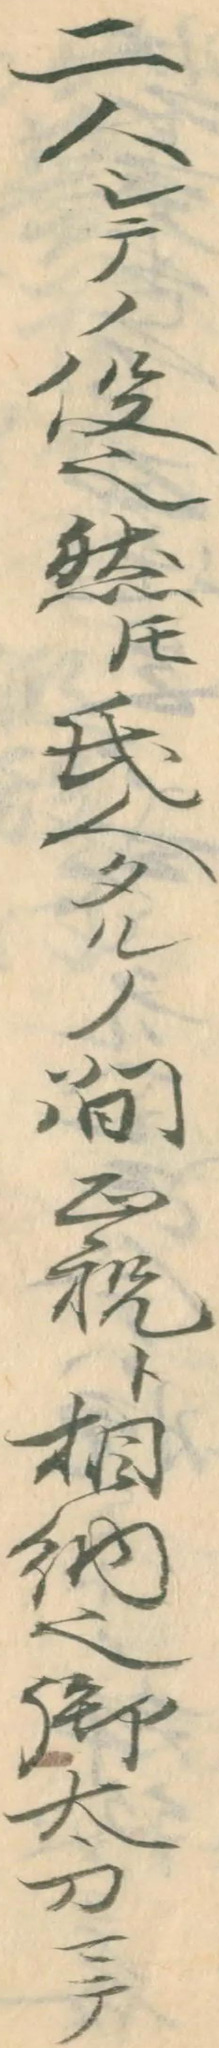二人シテノ役也然トモ氏人タルノ間正祝ト相納也御太刀マテ
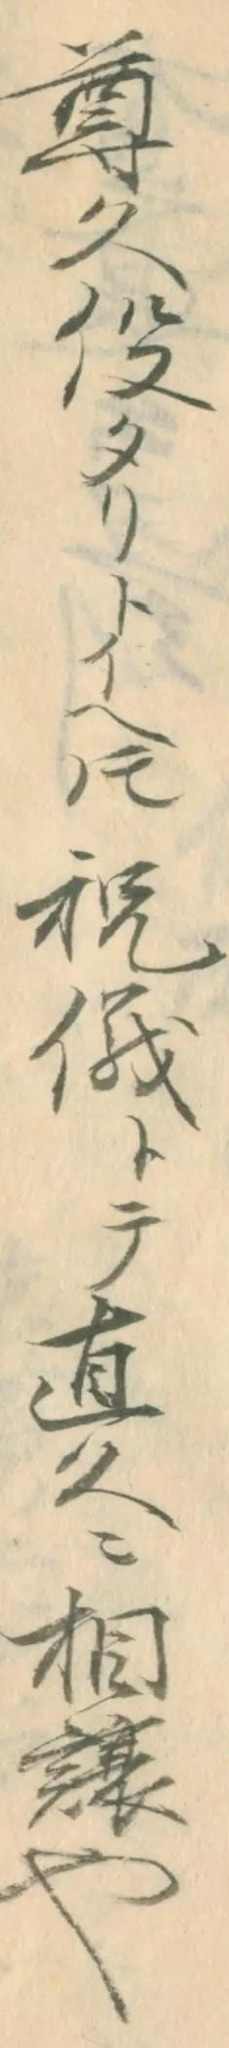尊久役タリトイヘトモ祝儀トテ直久ニ相譲也
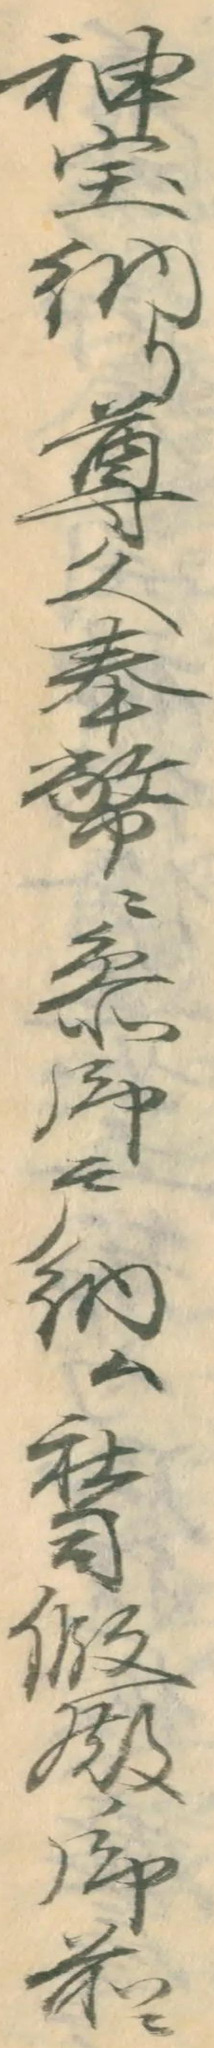一神宝納リ尊久奉幣ニ参御戸納ム社司仮殿ノ御前ニ

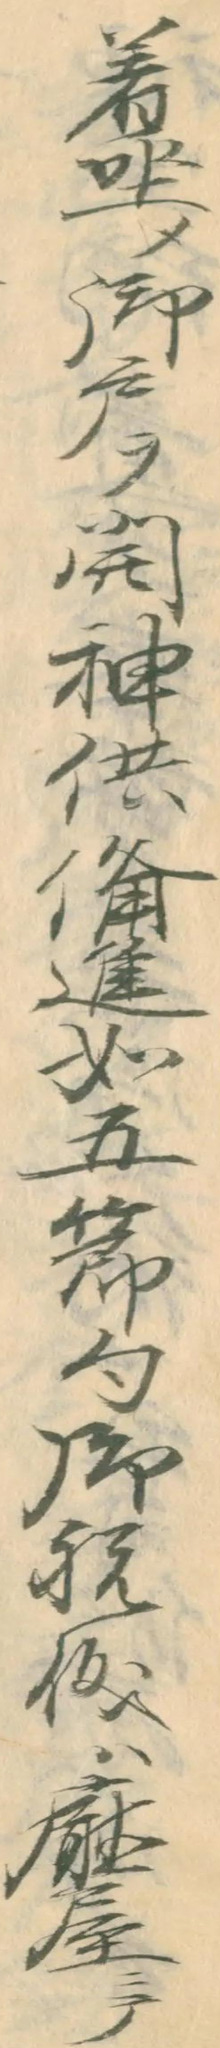着坐シテ御戸ヲ開神供備進如五節句御祝儀ハ庁屋ニテ
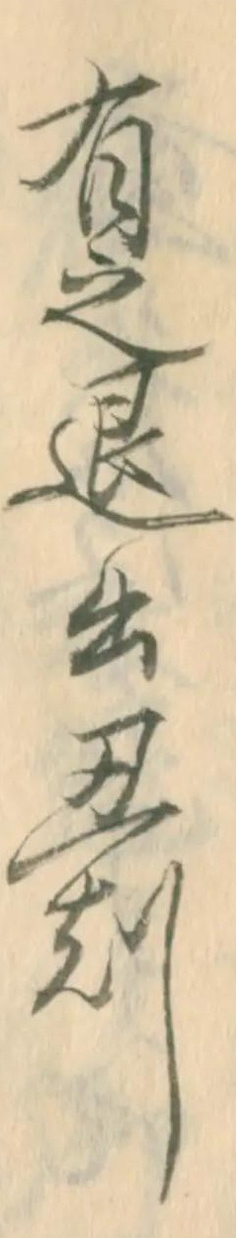有之退出丑刻
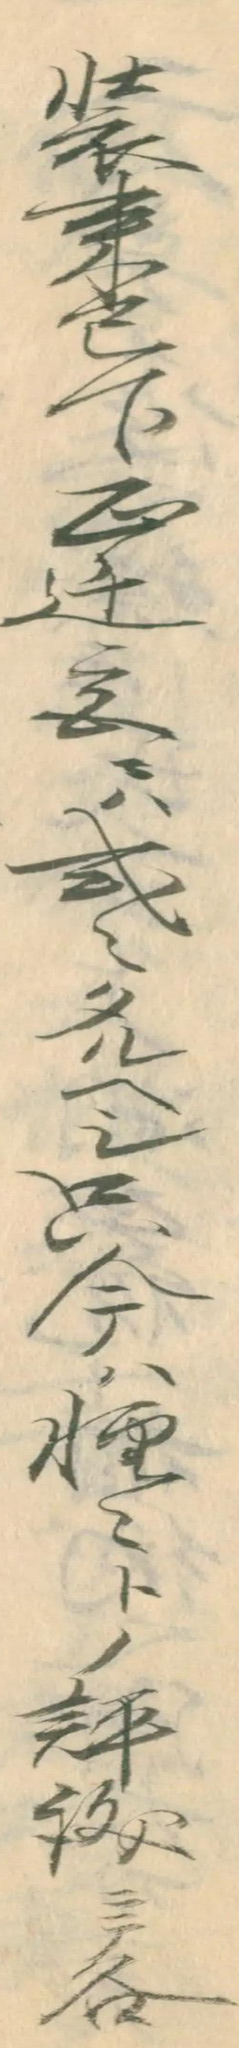一装束己下正遷宮ニハ式々タルヘシ只今ハ軽々トノ評議ニテ各
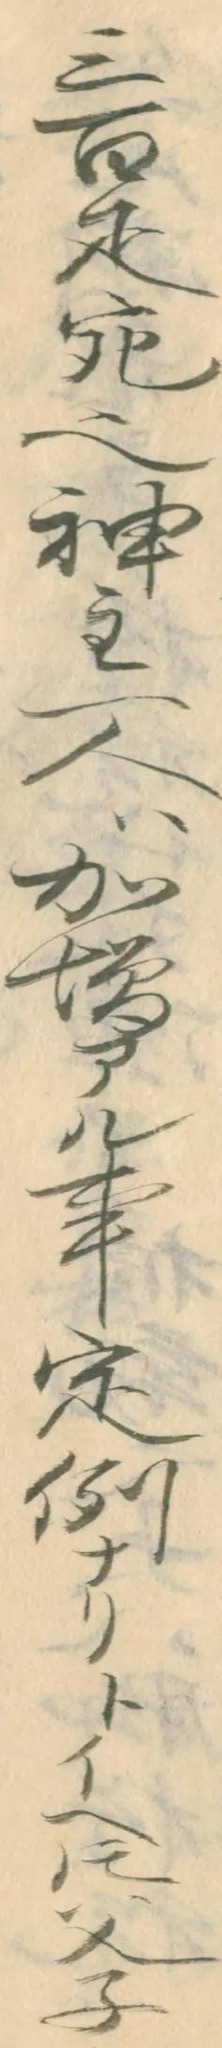三百疋宛也神主一人ハ加増アル事定例ナリトイヘトモ父子
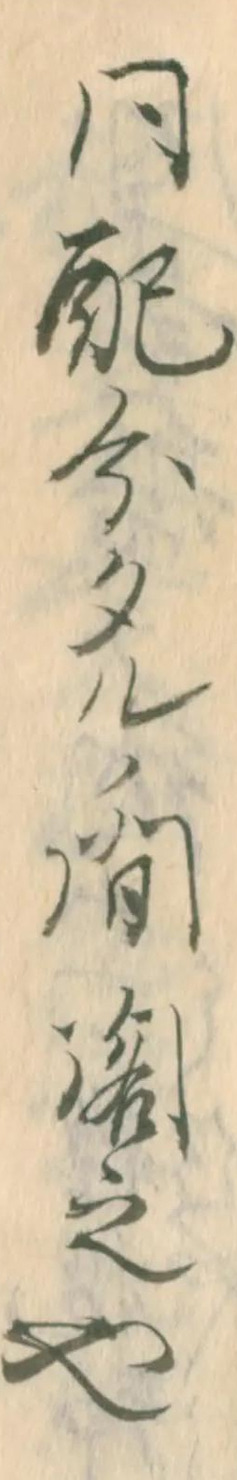同配分タルノ間閣之也
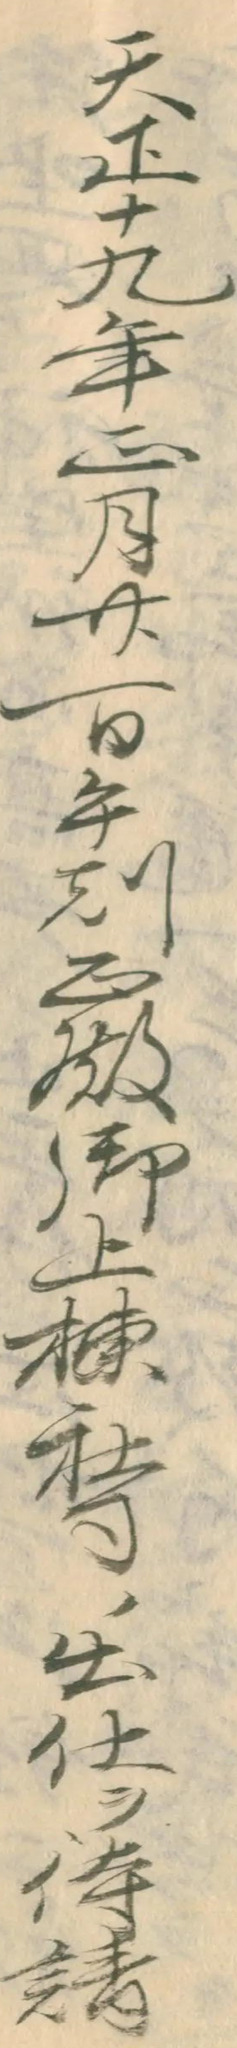一天正十九年正月廿一日午刻正殿御上棟社司ノ出仕ヲ待請
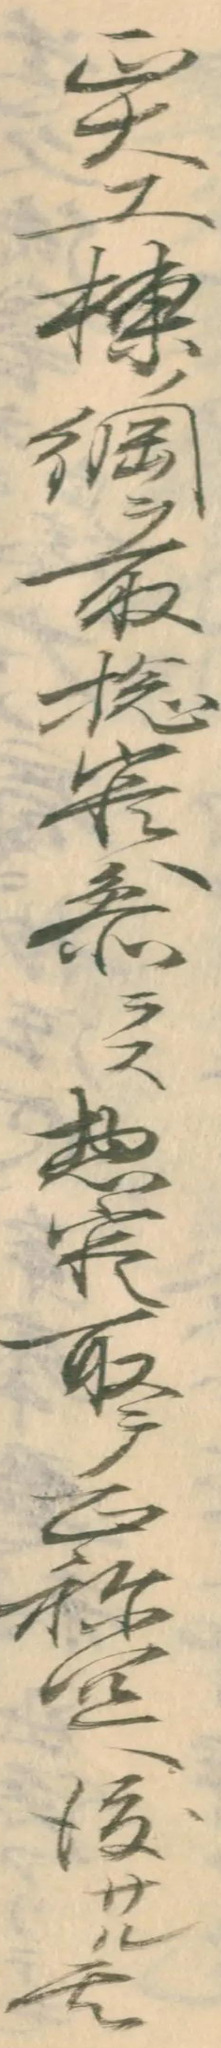正大工棟ノ綱ヲ取捻官参ラス惣官取テ正祢宜へ渡サル其
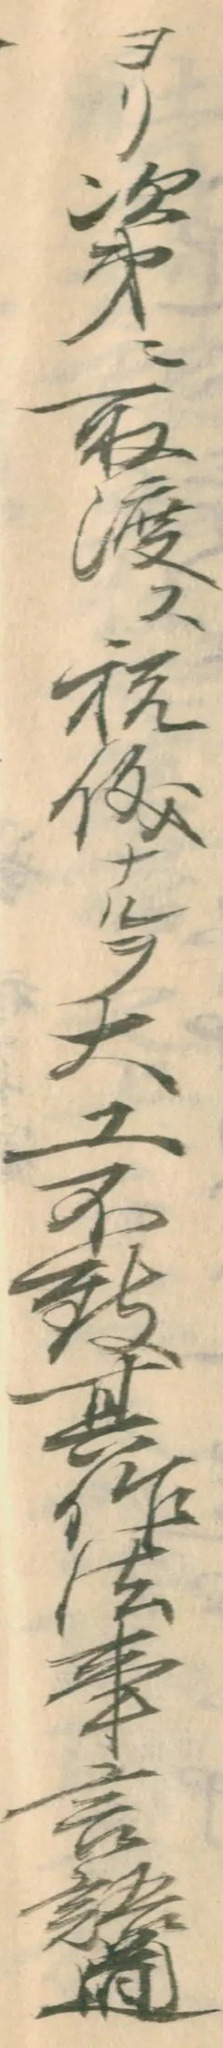ヨリ次第ニ取渡ス祝儀ナルヲ大工不致其作法事言語道
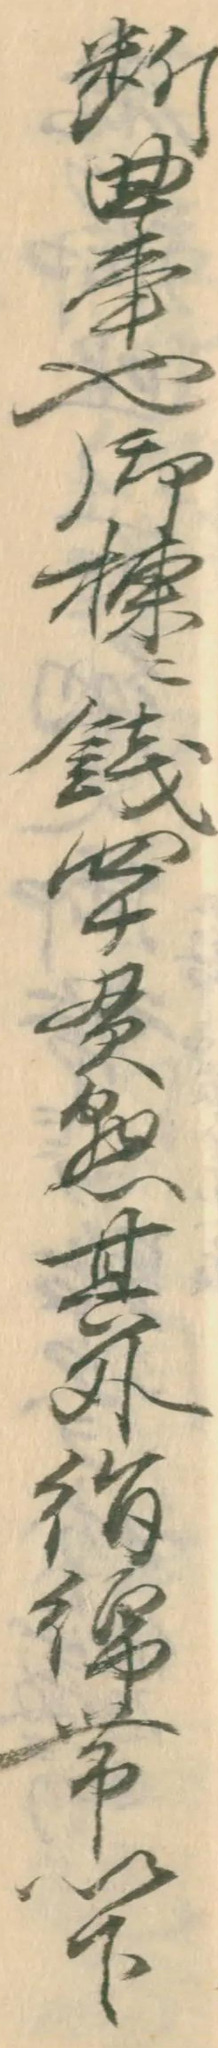断曲事也御棟ニ銭四十貫懸其外絹綿帯以下
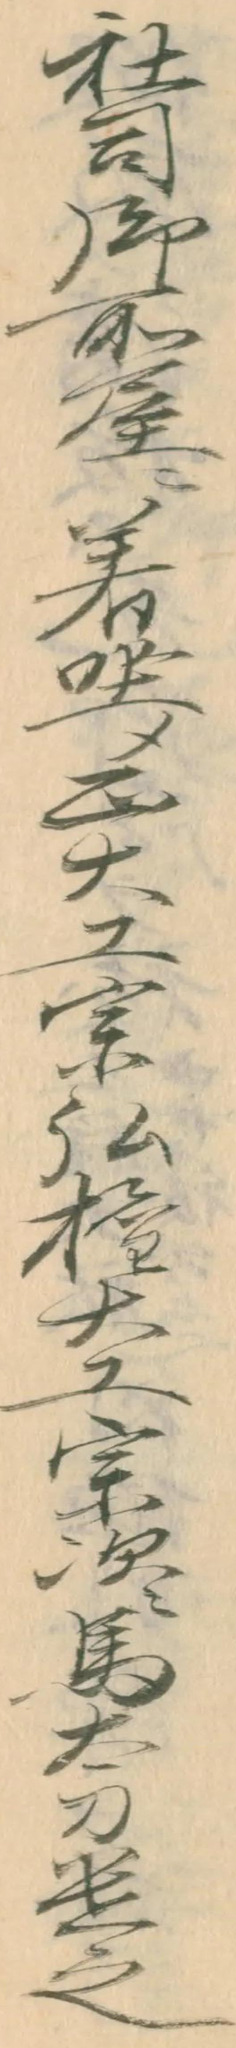社司御所屋ニ着坐シテ正大工宗弘権大工宗次ニ馬太刀遣之
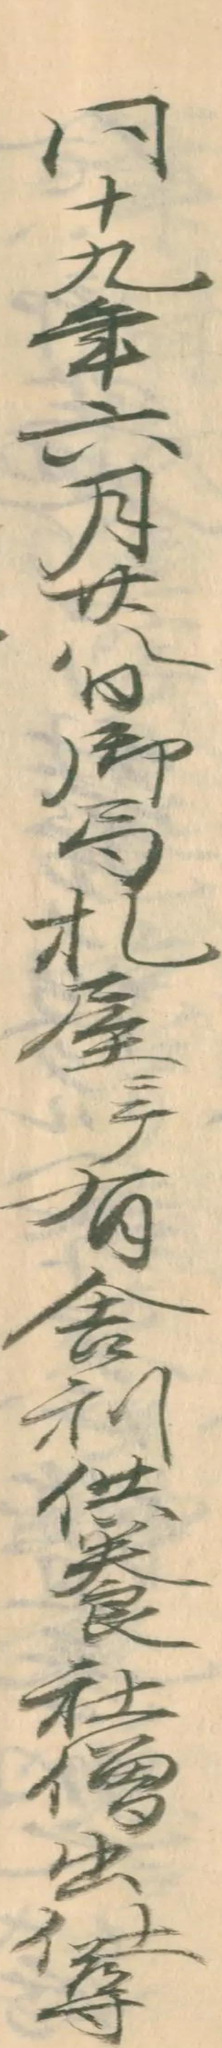一同十九年六月廿八日御局札屋ニテ有舎利供養社僧出仕尋
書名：賀茂社記録. 第15冊
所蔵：国立国会図書館 National Diet Library, JAPAN
